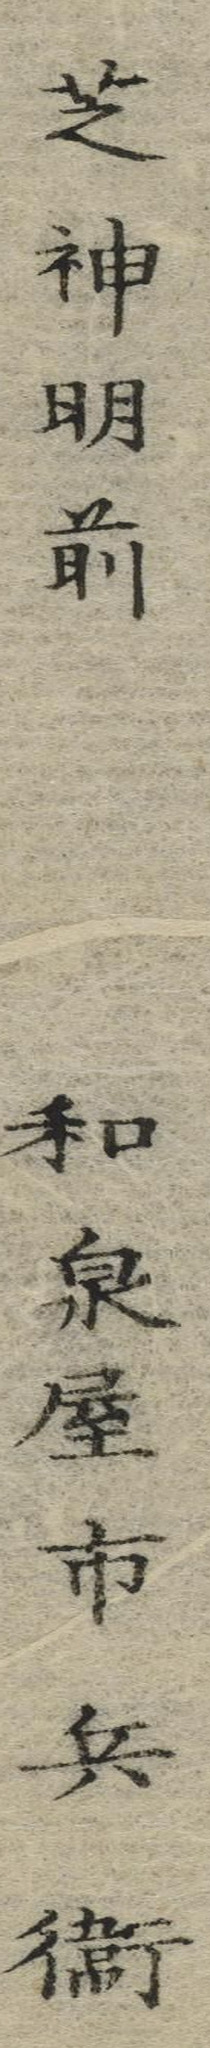芝神明前和泉屋市兵衛
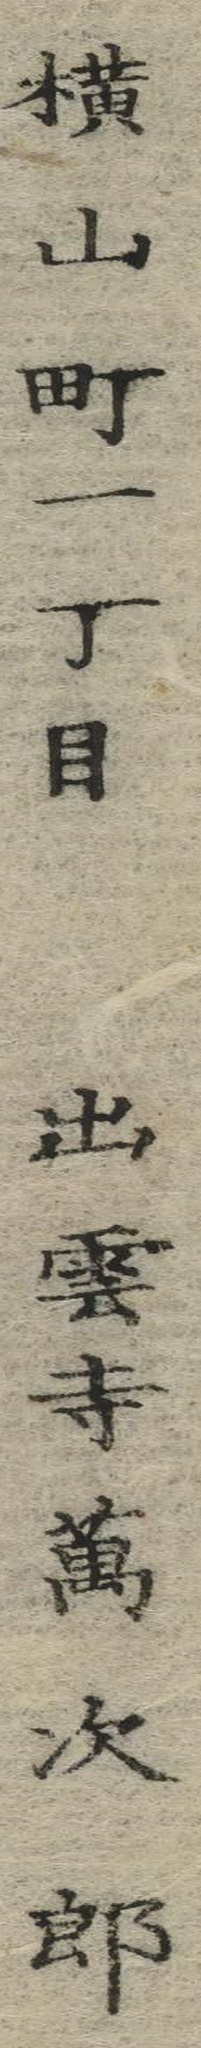横山町一丁目出雲寺万次郎
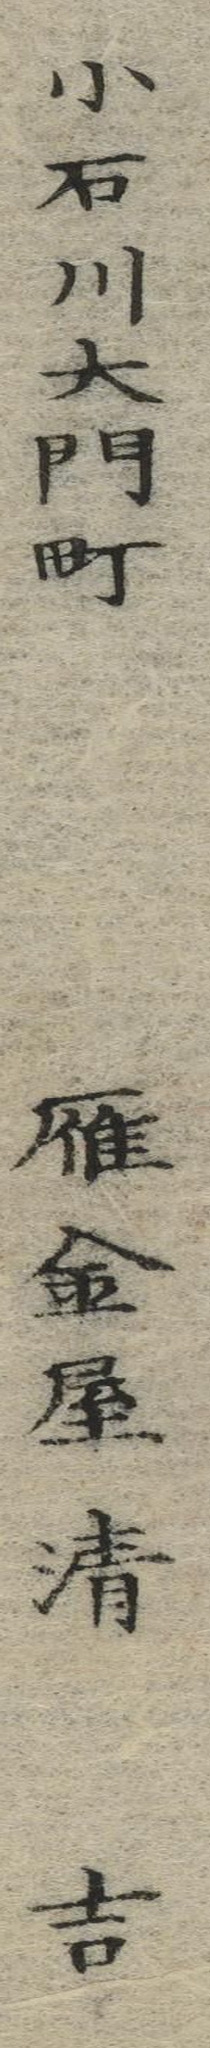小石川大門町雁金屋清吉
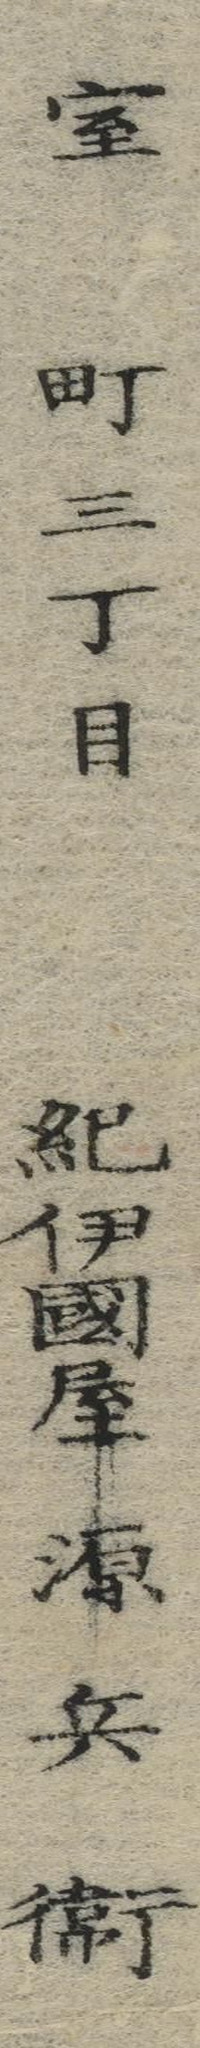宝町三丁目紀伊国屋源兵衛
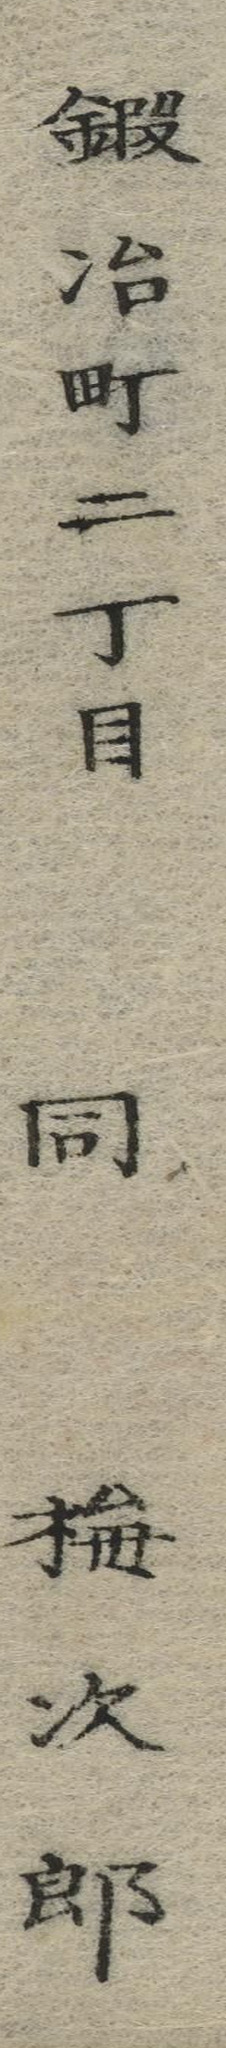鍛冶町二丁目同梅次郎
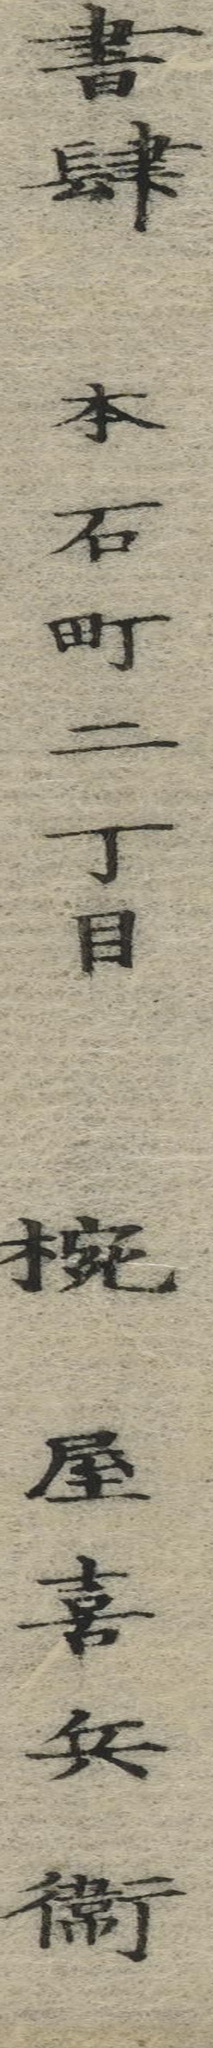本石町二丁目椀屋喜兵衛
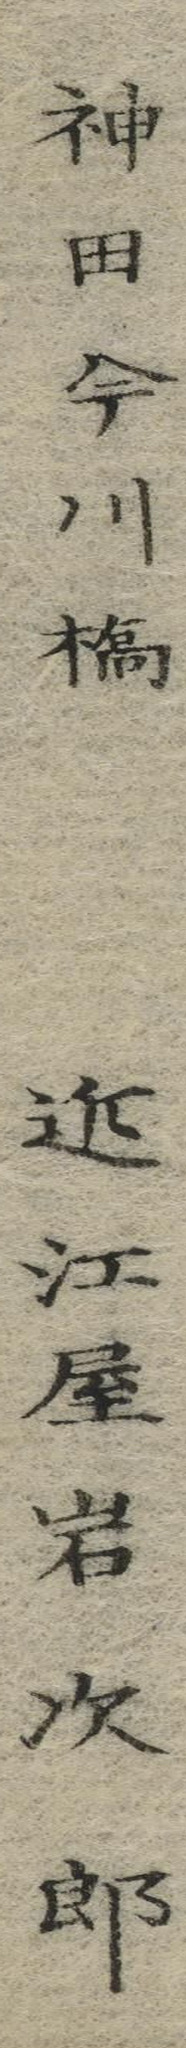神田今川橋近江屋岩次郎
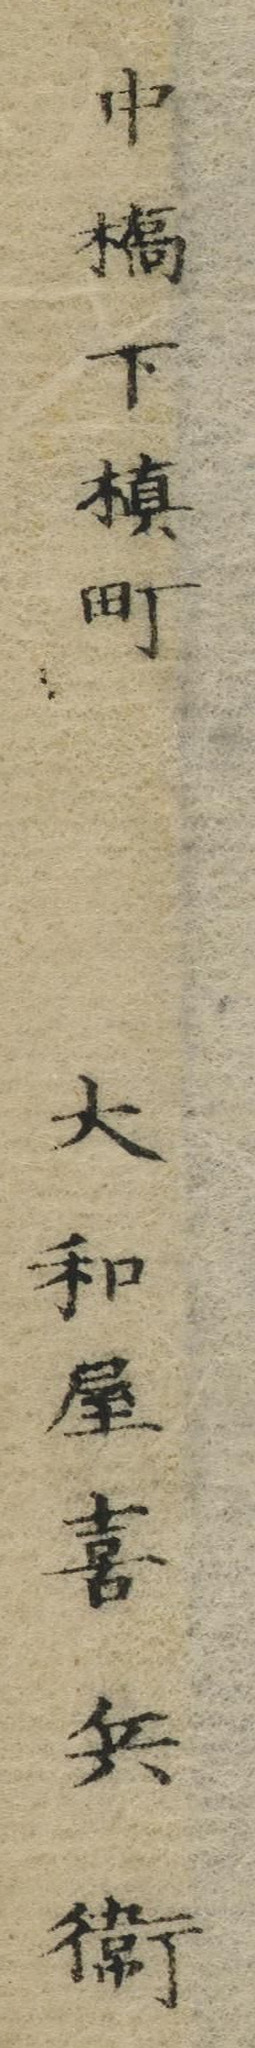中橋下槙町大和屋喜兵衛
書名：暦日往来　單
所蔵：東京大学地震研究所図書室 Earthquake Research Institute Library, The University of Tokyo, JAPAN
